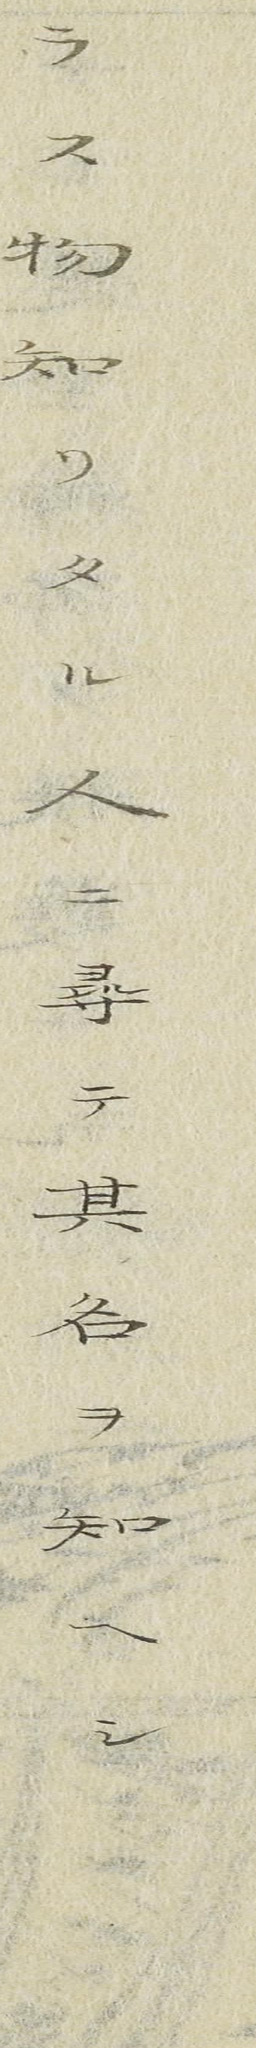ラス物知リタル人ニ尋テ其名ヲ知ヘシ
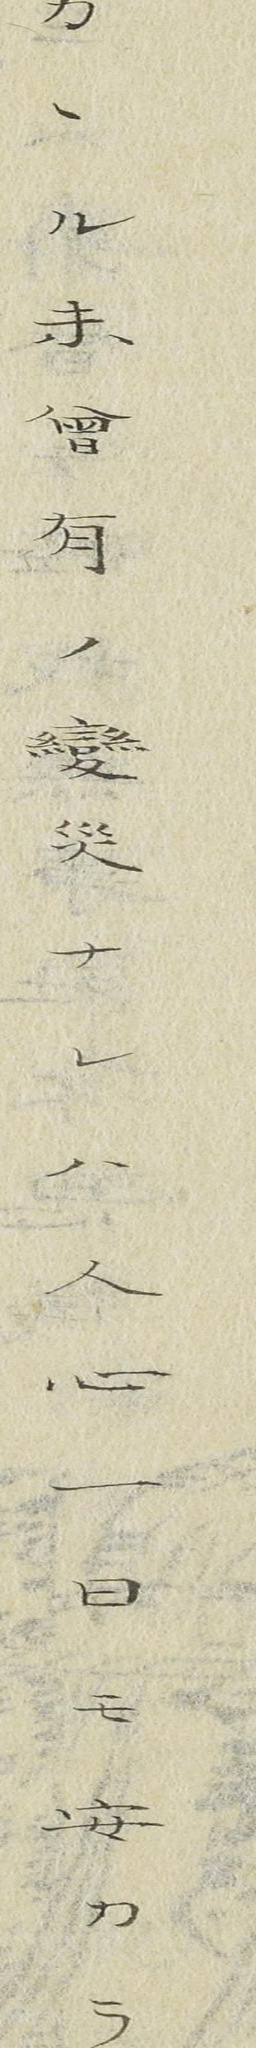カヽル未曾有ノ変災ナレハ人心一日モ安カラ
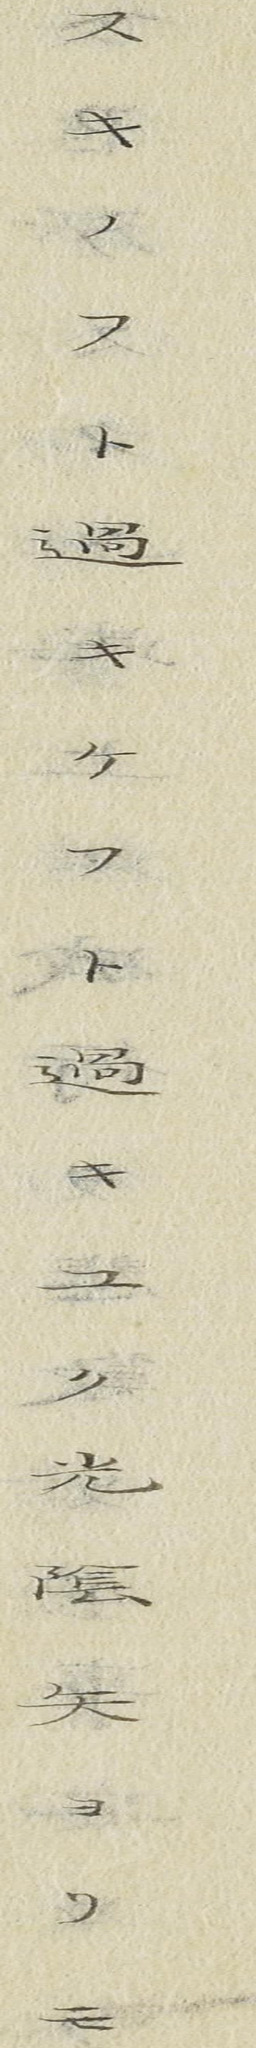スキノフト過キケフト過キユク光陰矢ヨリモ
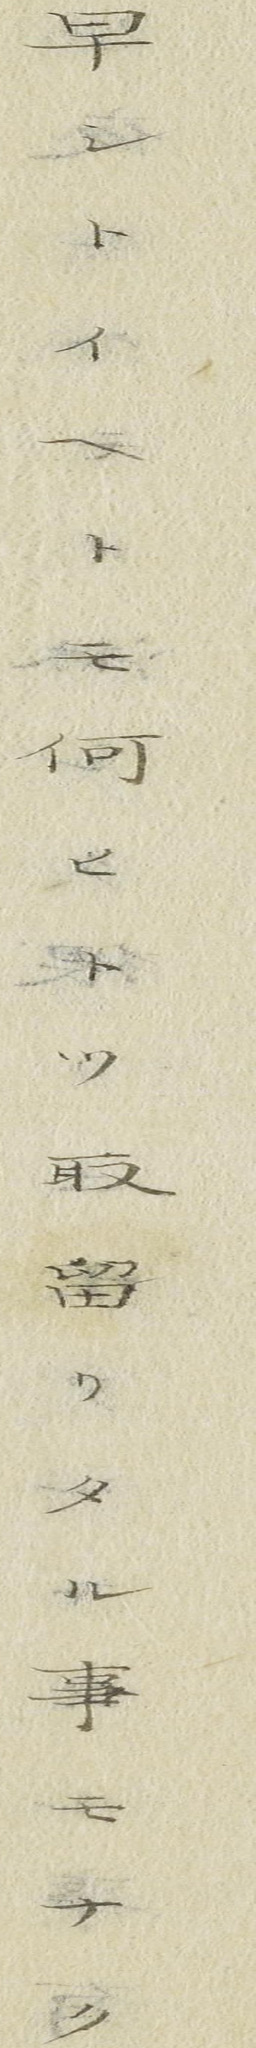早シトイヘトモ何ヒトツ取留リタル事モナク
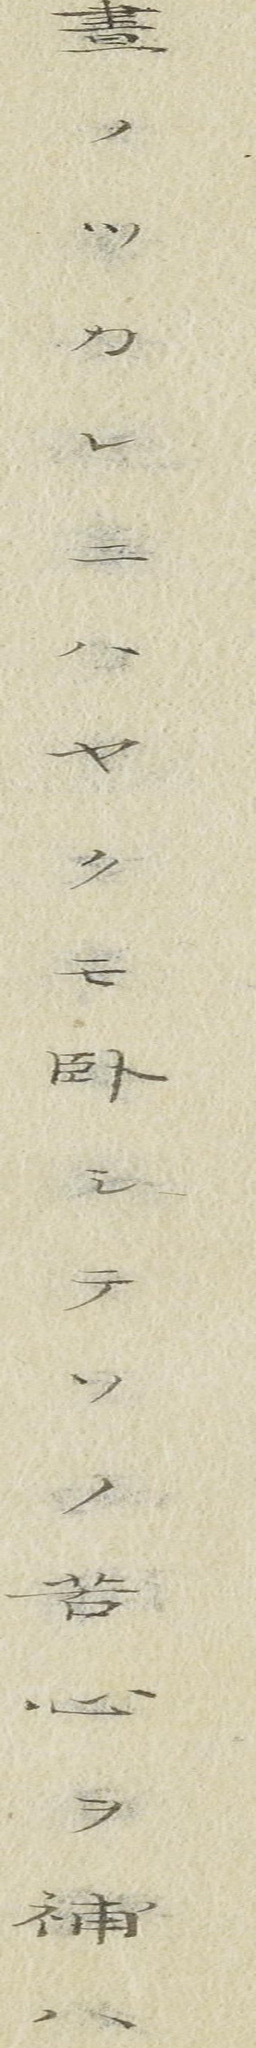昼ノツカレニハヤクモ卧シテソノ苦心ヲ補ハ
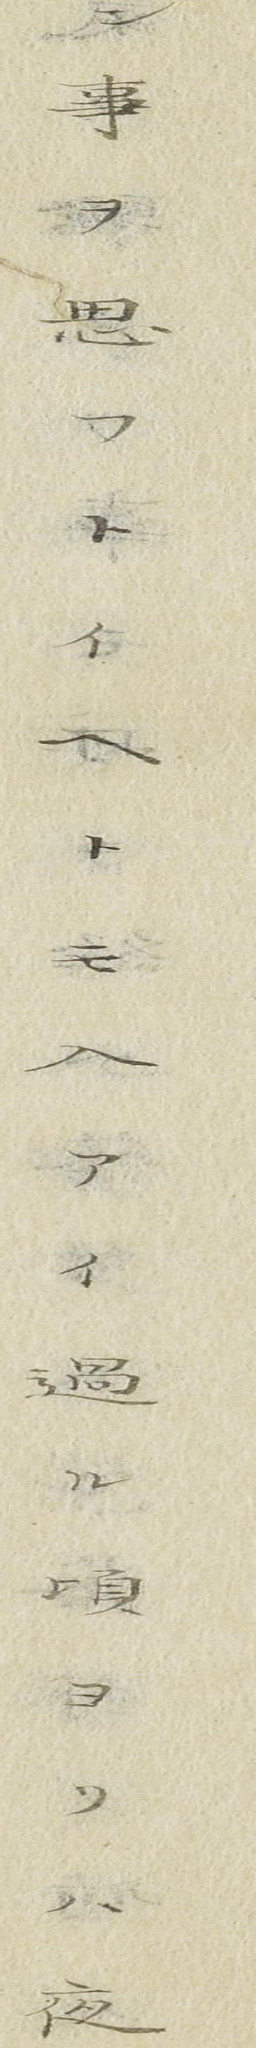ン事ヲ思フトイヘトモ入アイ過ル頃ヨリハ夜
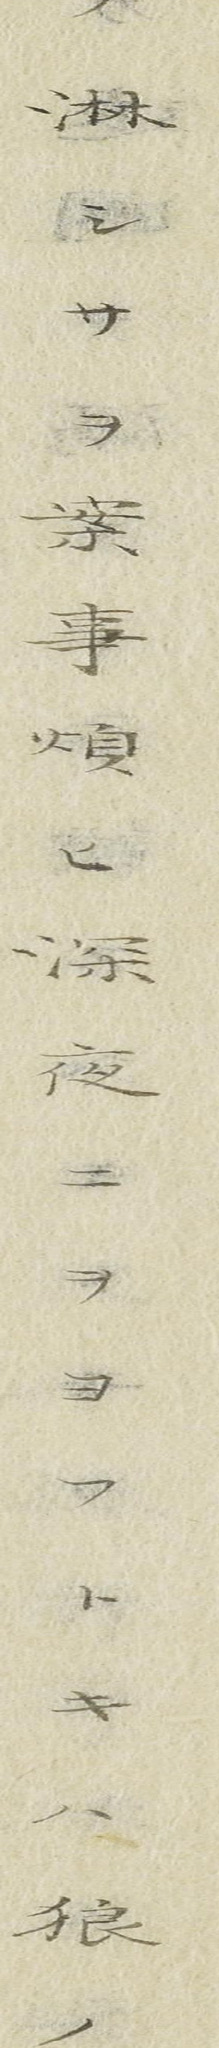ノ淋シサヲ案事煩ヒ深夜ニヲヨフトキハ狼ノ
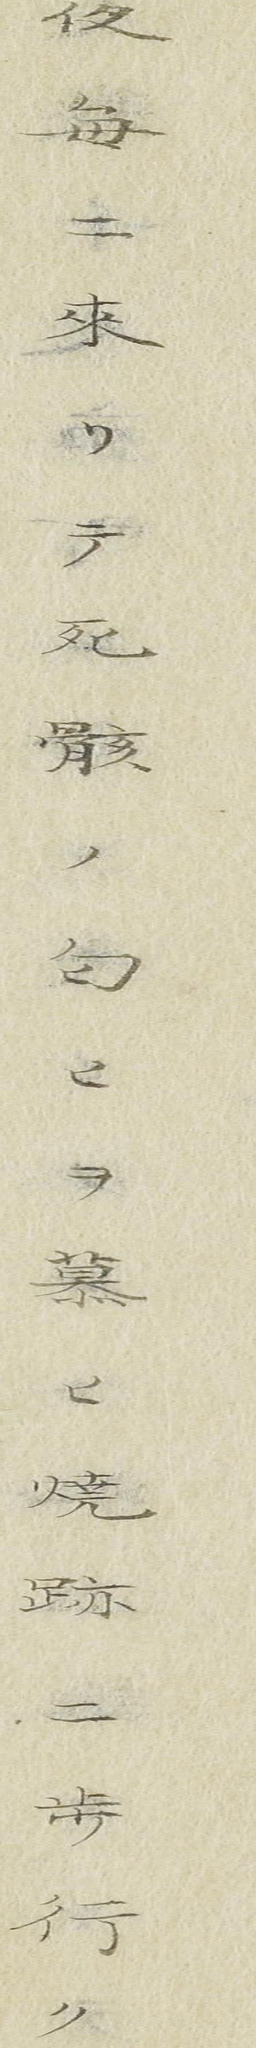夜毎ニ来リテ死骸ノ匂ヒヲ慕ヒ焼跡ニ歩行ク
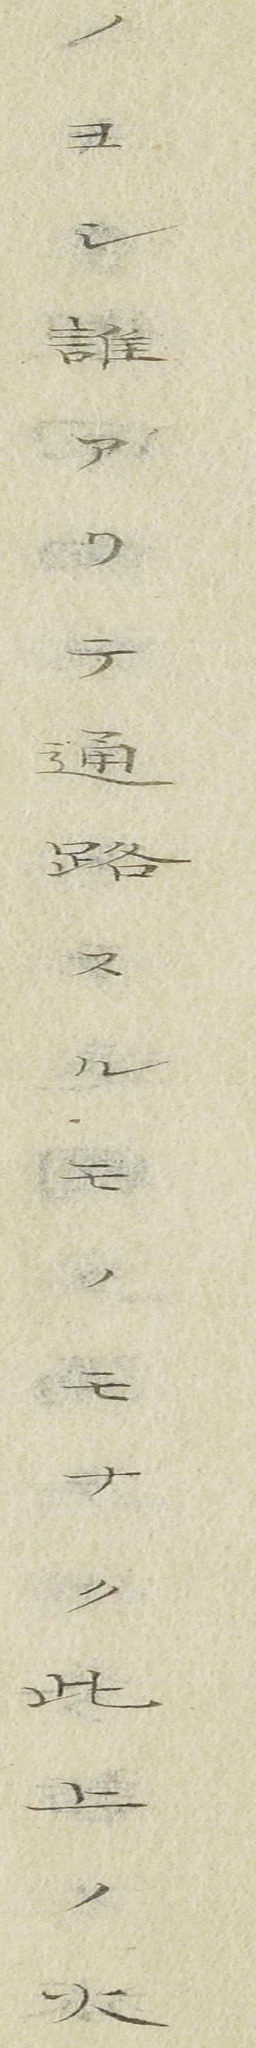ノヨシ誰アリテ通路スルモノモナク此上ノ火
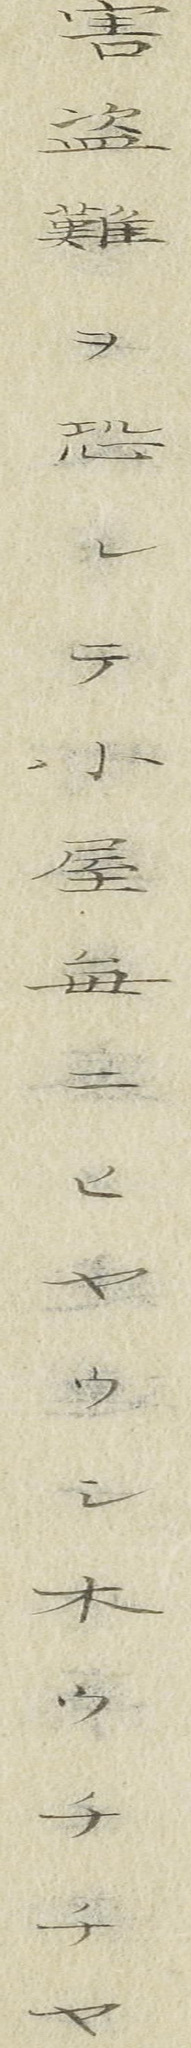害盗難ヲ恐レテ小屋毎ニヒヤウシ木ウチチヤ
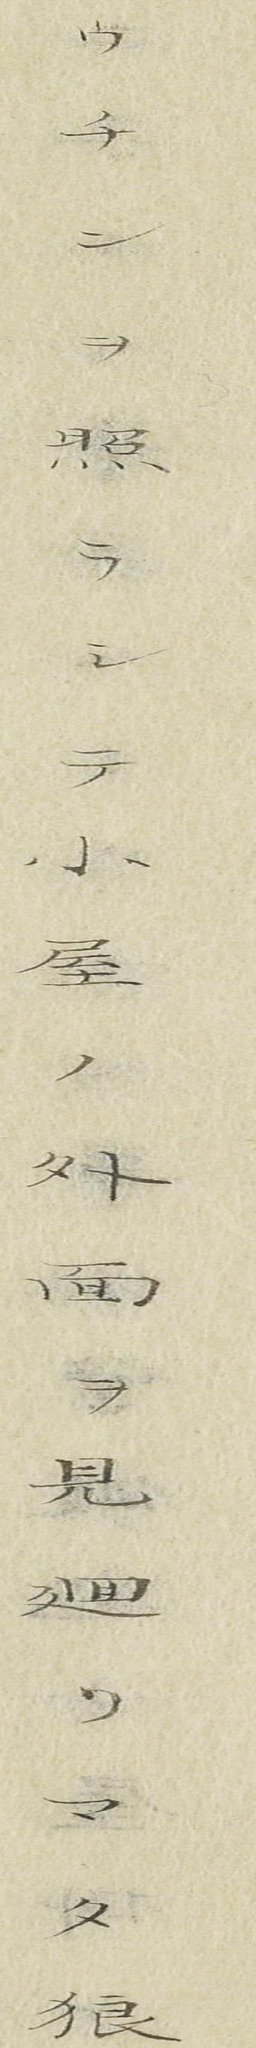ウチンヲ照ラシテ小屋ノ外面ヲ見廻リマタ狼
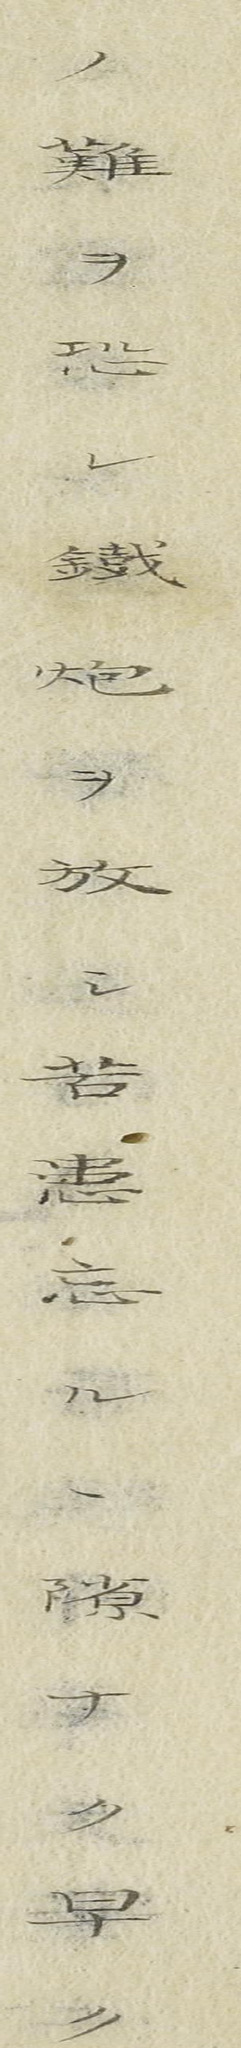ノ難ヲ恐レ鉄炮ヲ放シ苦患忘ルヽ隙ナク早ク

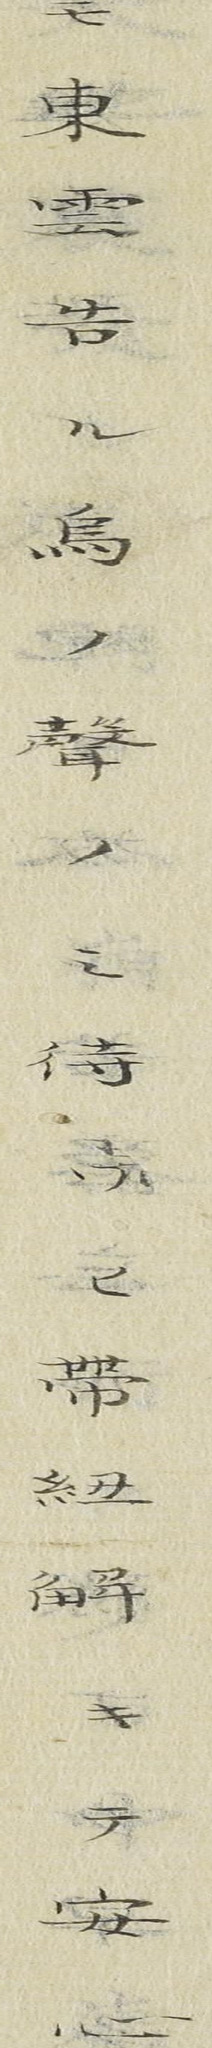モ東雲告ル鳥ノ声ノミ待ワヒ帯紐解キテ安心
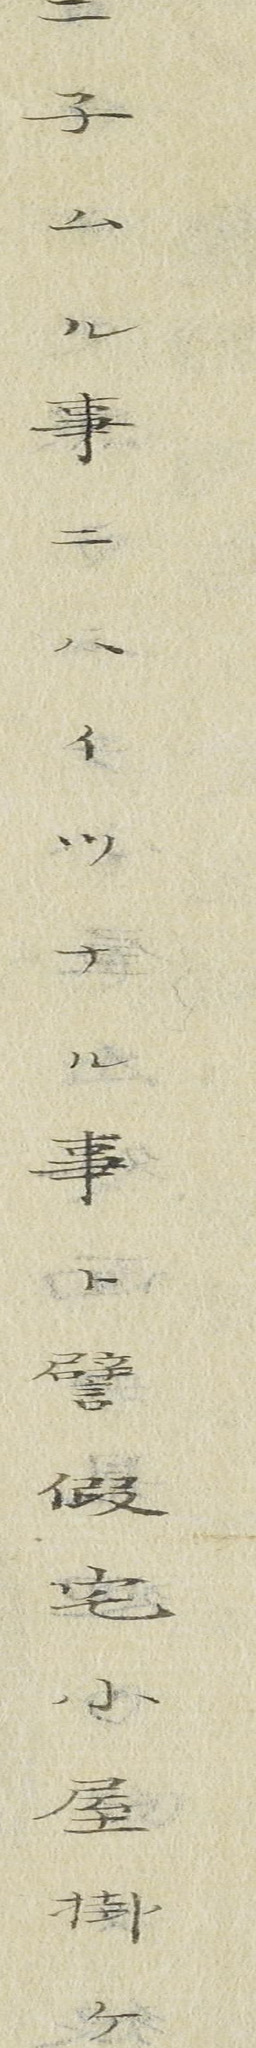ニ子ムル事ニハイツナル事ト譬仮宅小屋掛ケ
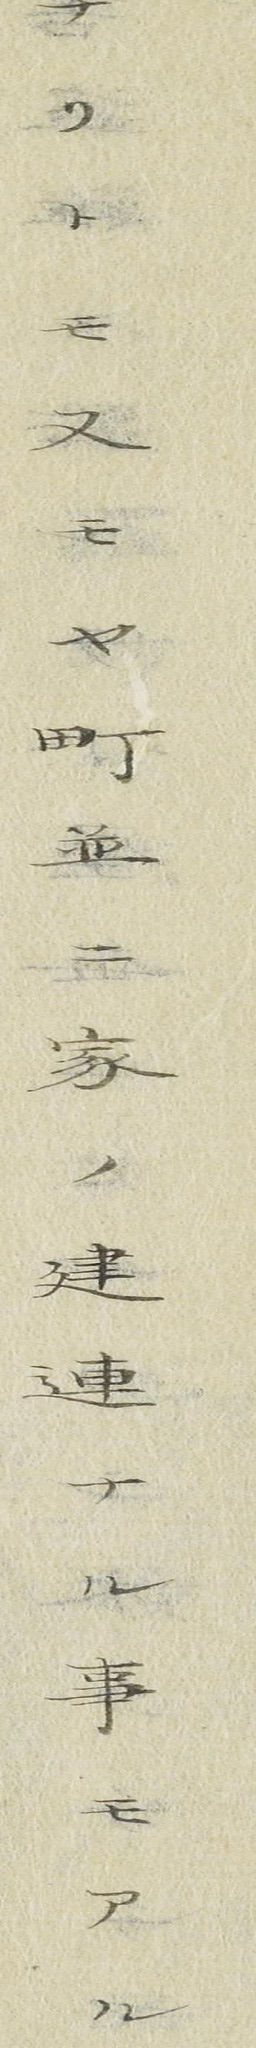ナリトモ又モヤ町並ニ家ノ建連ナル事モアル
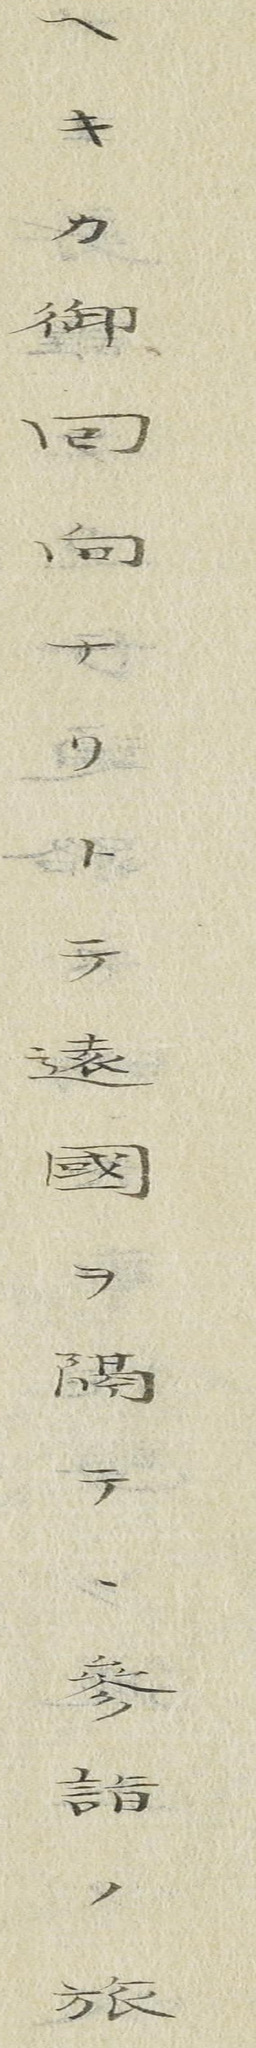ヘキカ御回向ナリトテ遠国ヲ隔テヽ参詣ノ旅
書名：地災撮要　地震之部　巻ノ二
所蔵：東京大学地震研究所図書室 Earthquake Research Institute Library, The University of Tokyo, JAPAN
